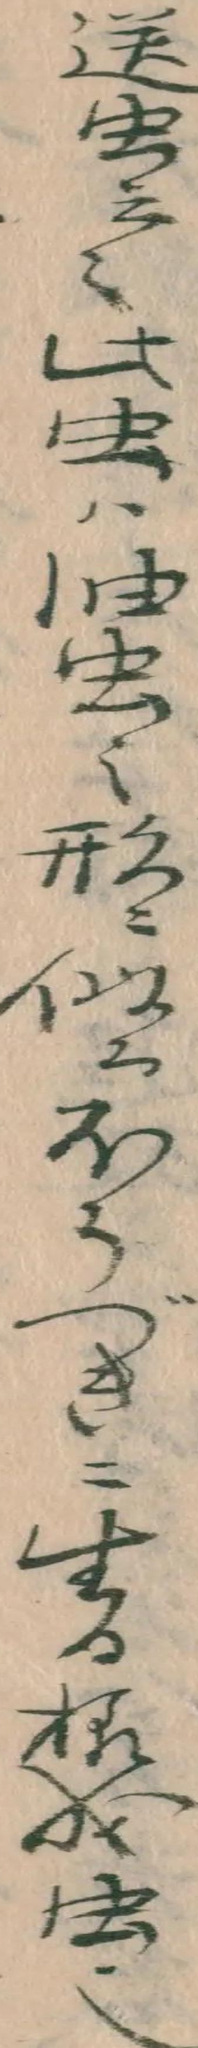送虫云々此虫ハ油虫之形ニ似而ほうづきニ生る様成虫也
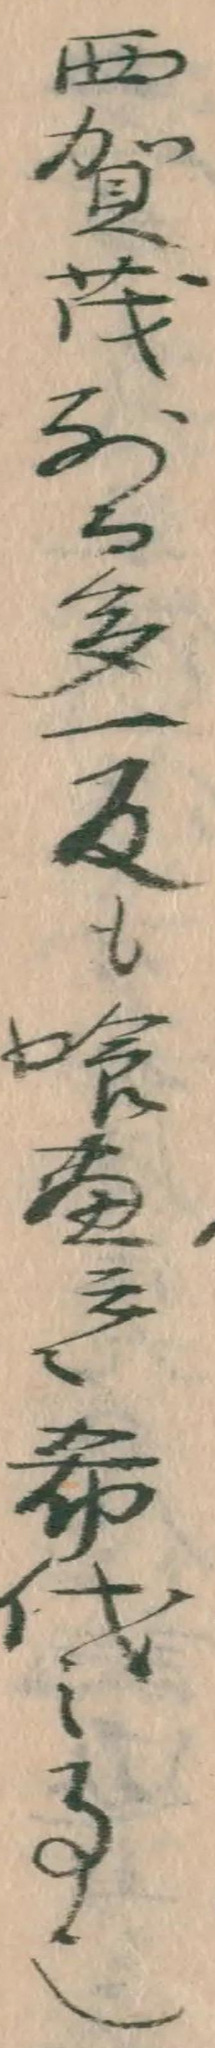西賀茂別而多一反も喰尽云々希代之事也
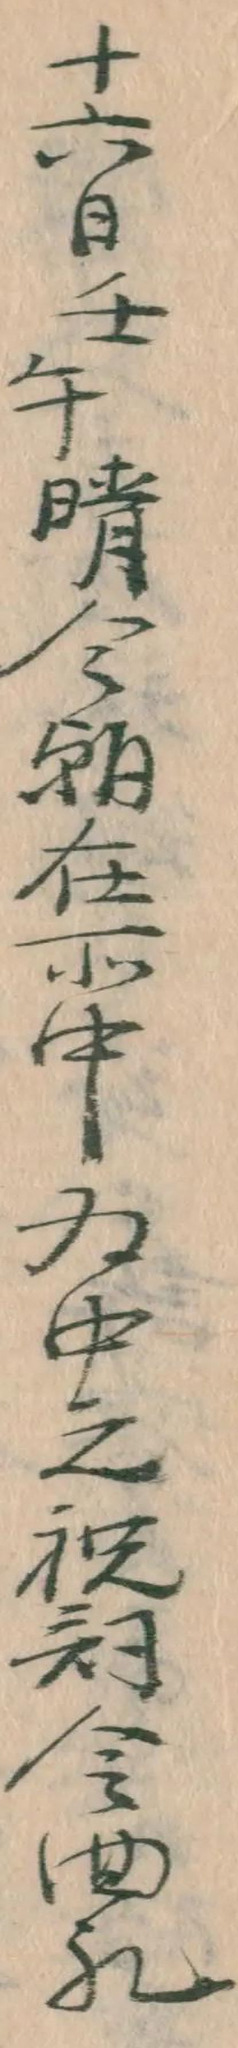十六日壬午晴今朝在所中為中元祝詞令回礼
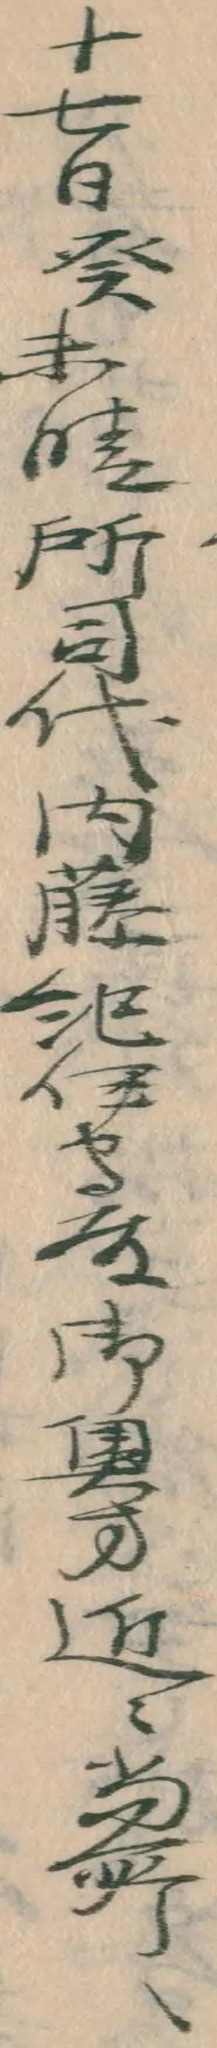十七日癸未晴所司代内藤紀伊守殿御奥方近々当所へ
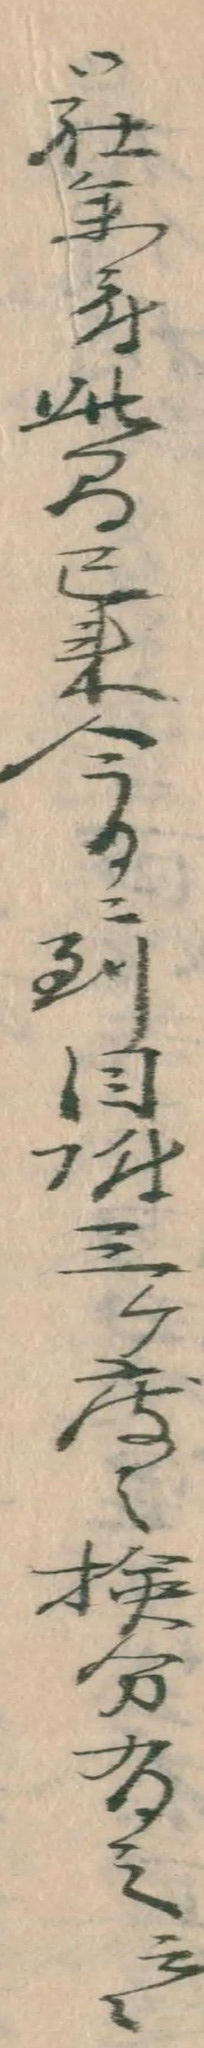御社参ニ付此間己来今日ニ到目付三ヶ度之検分有之云々
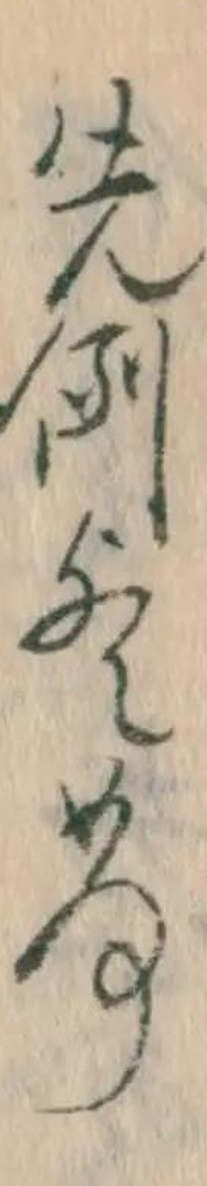先例歟如何
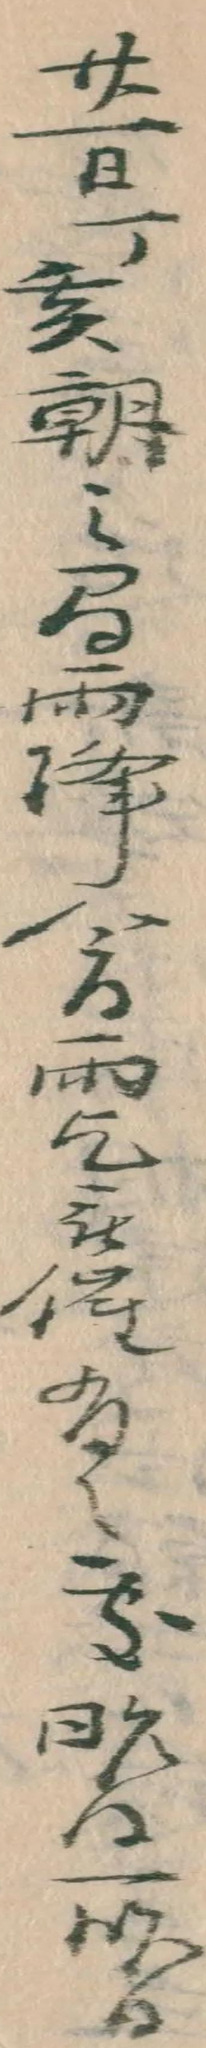廿一日丁亥朝之間雨降今日雨乞被催有之処昨日一昨日
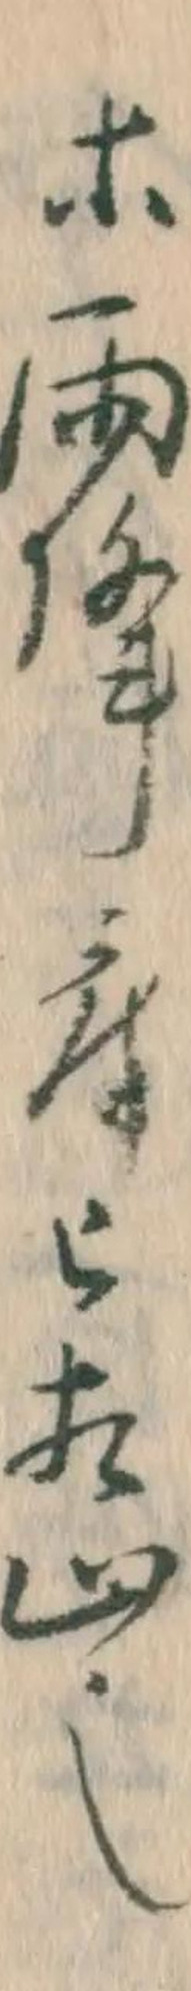等雨降ニ付被相止也
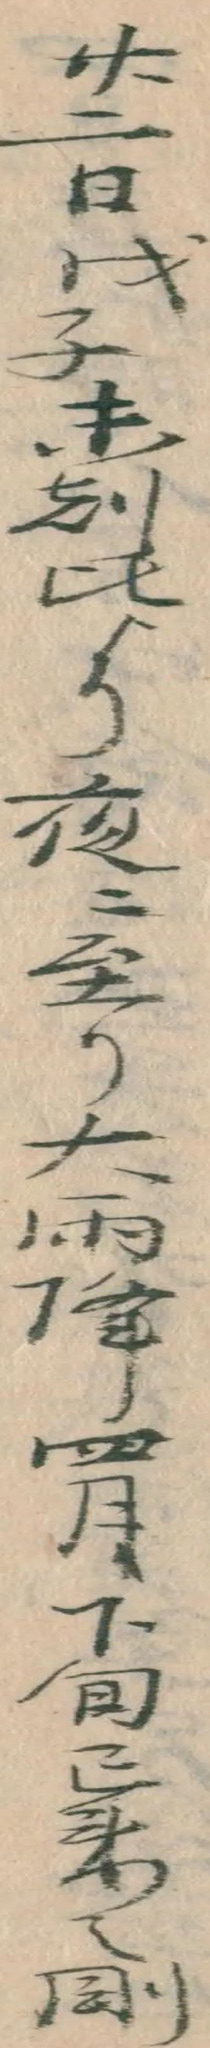廿二日戊子未刻比より夜ニ至り大雨降四月下旬己来之剛
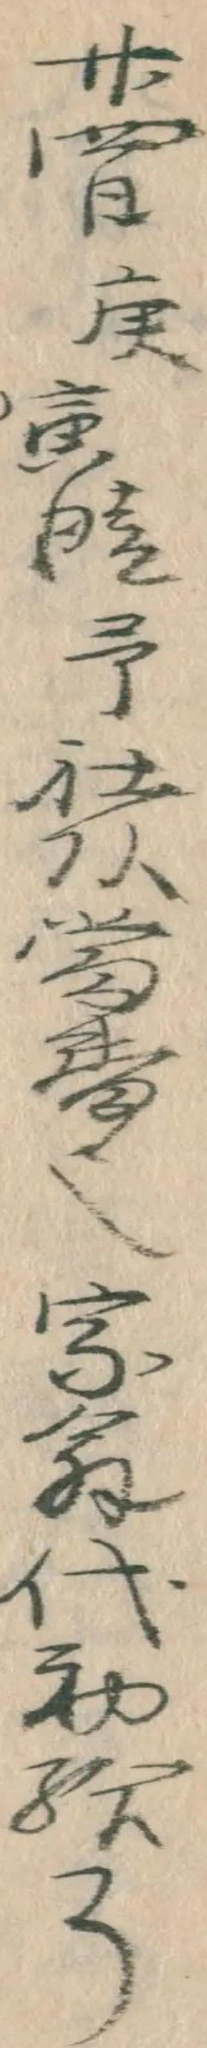廿四日庚寅晴予社頭当番也家翁代勤給了
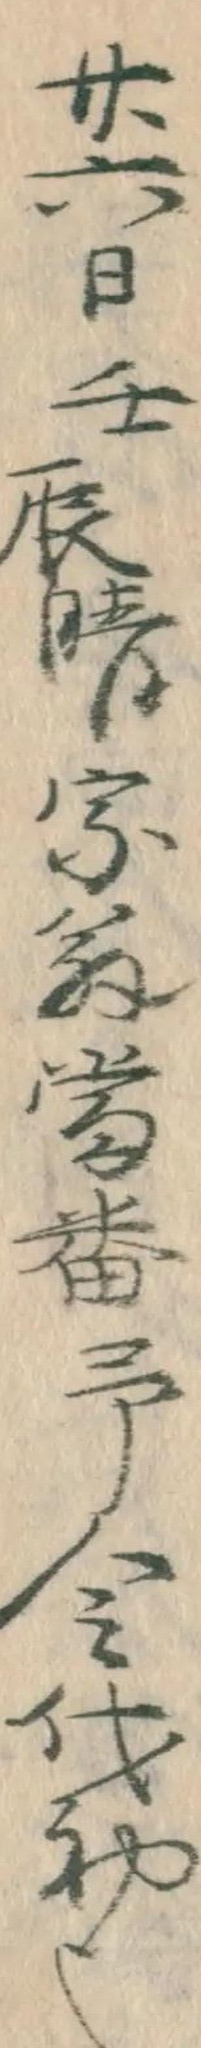廿六日壬辰晴家翁当番予令代勤也
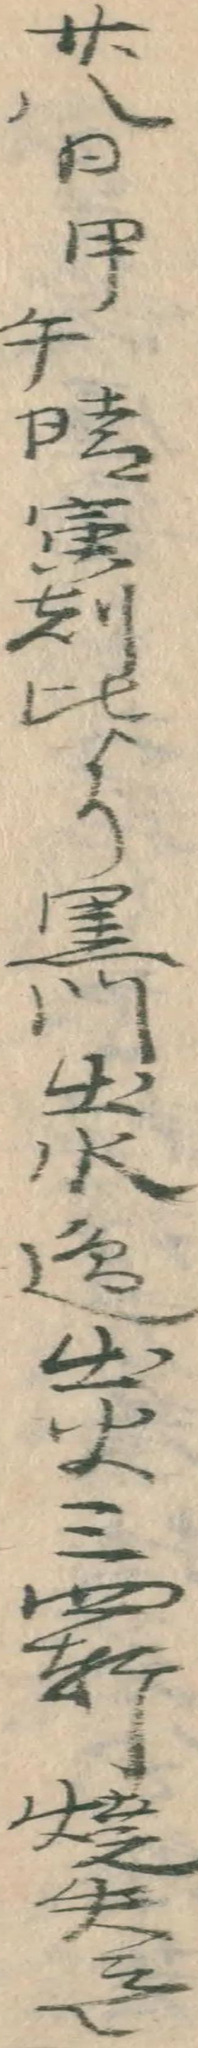廿八日甲午晴寅刻比より黒門出水辺出火三四軒焼失云々
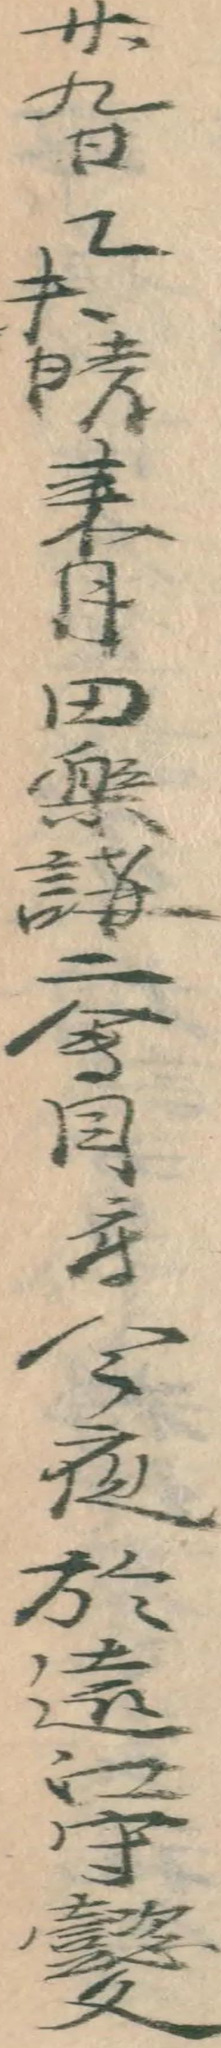廿九日乙未晴来月田楽講二會目ニ付今夜於遠江守懿久

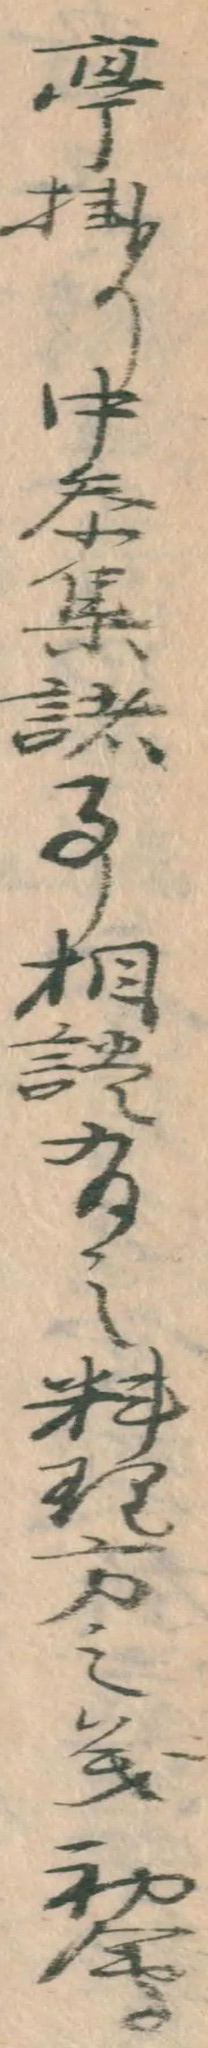亭掛り中参集諸事相談有之料理方之義初会
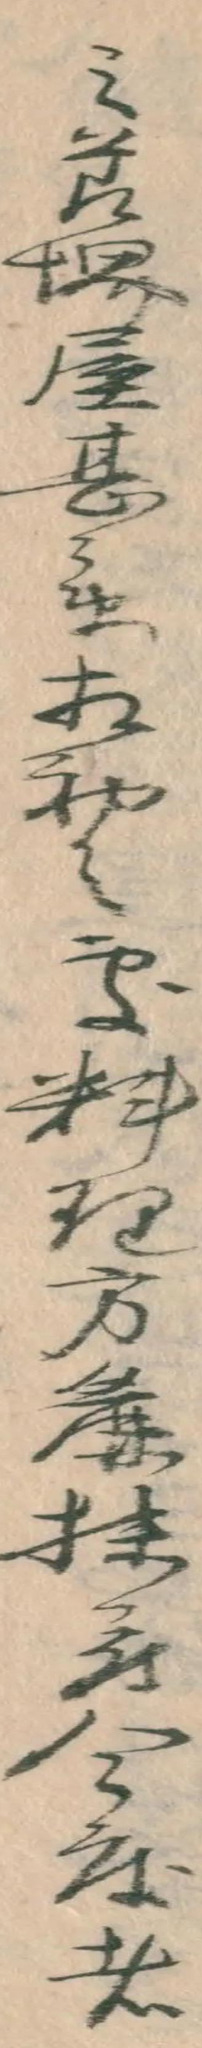之節堺屋甚兵衛相勤之処料理方麁抹ニ付今度者
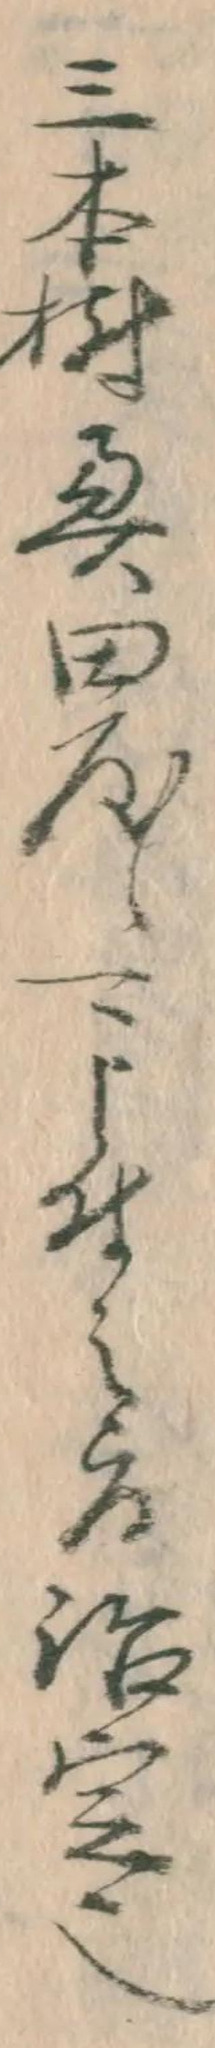三本樹奥田屋へ可申付之旨治定也
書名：賀茂社記録. 第64冊
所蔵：国立国会図書館 National Diet Library, JAPAN
